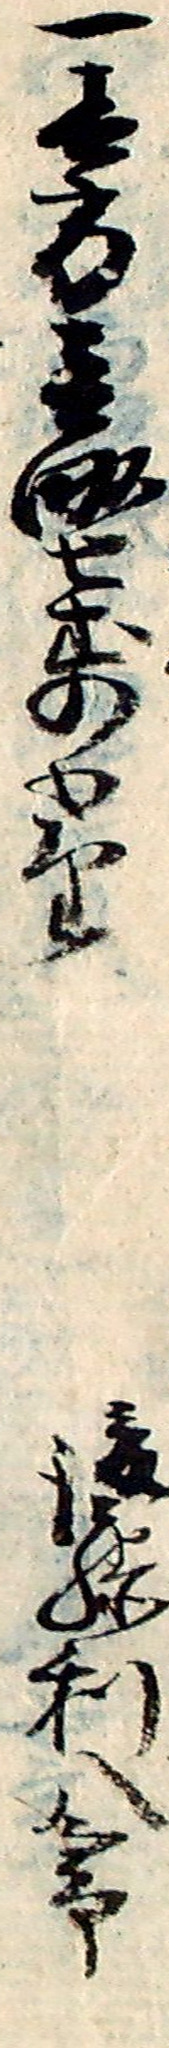一壱方壱畝七歩五厘後藤利八郎
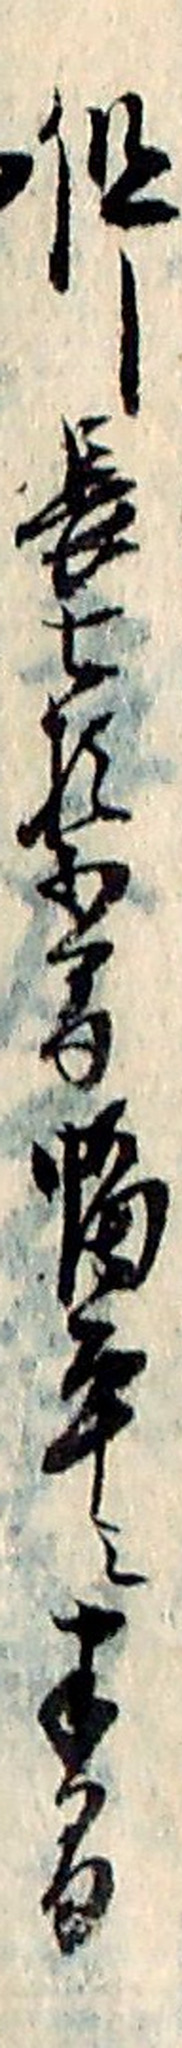但し長七拾五間幅平し半間
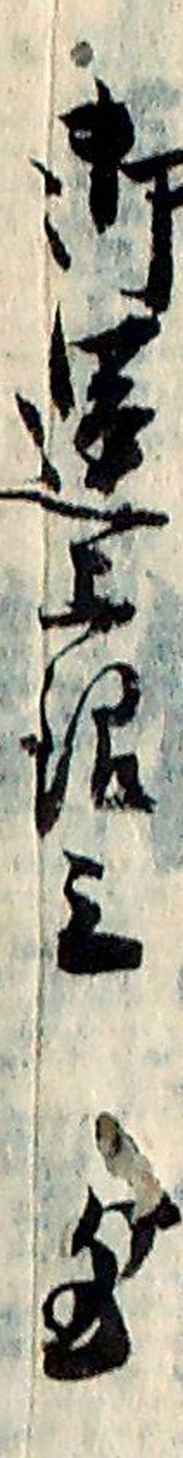御運上銀三匁
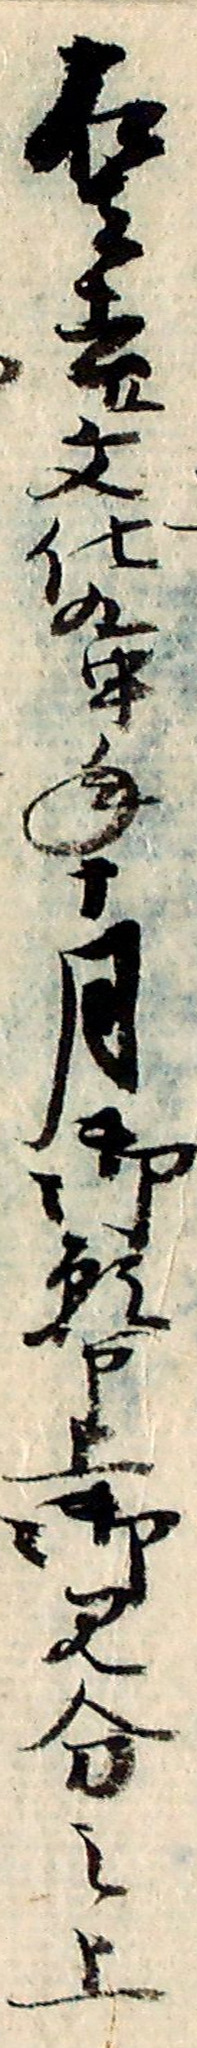右は去る文化九申年十月御願申上御見分之上
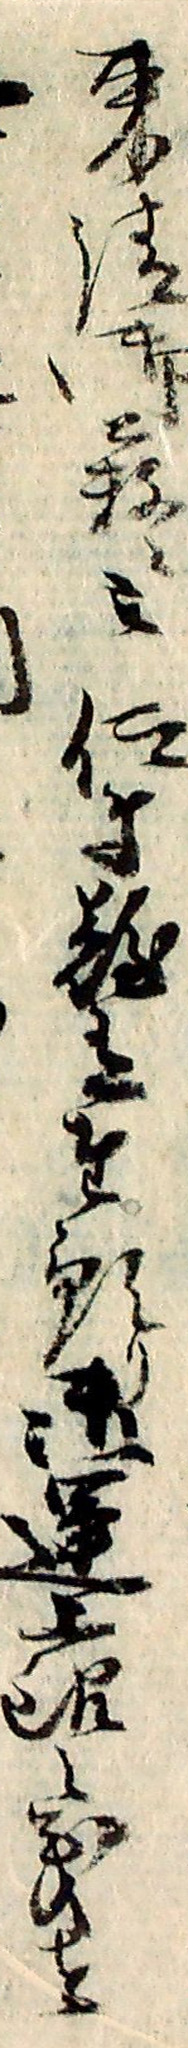束請御藪に被仰付難有奉預り御運上銀之義は
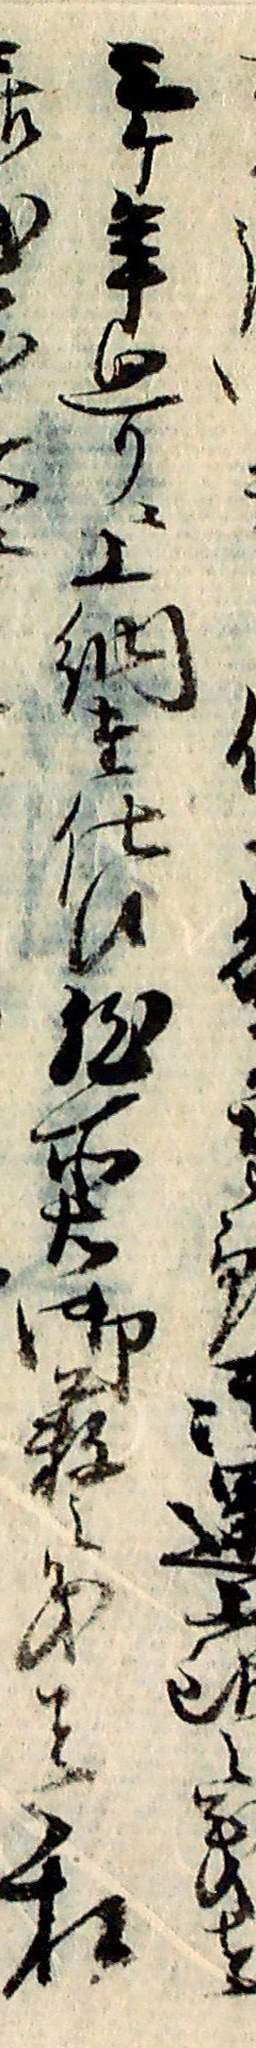三ケ年廻りに上納奉仕候然所右御藪之義は私
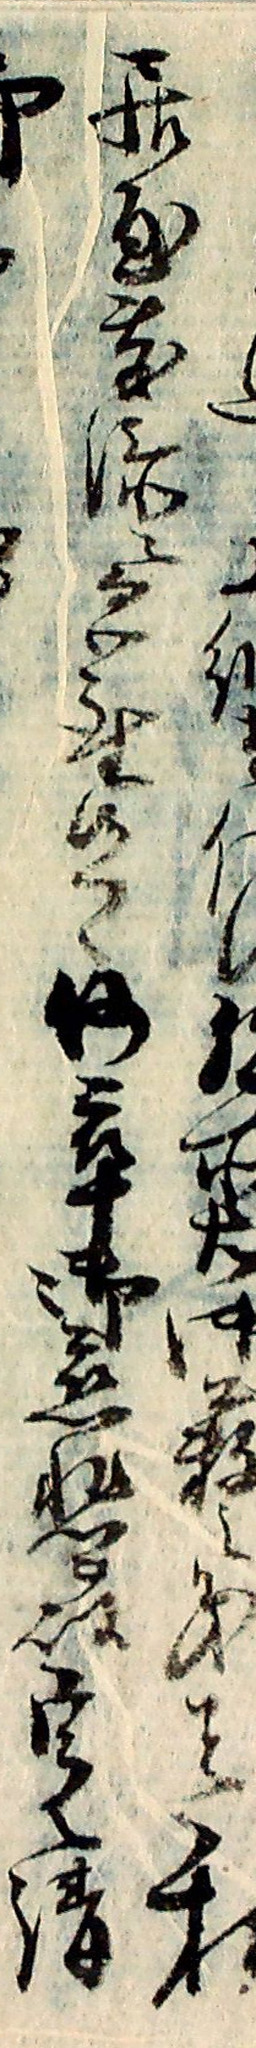居屋敷添にて御座候はゝ何卒御慈悲を以定請
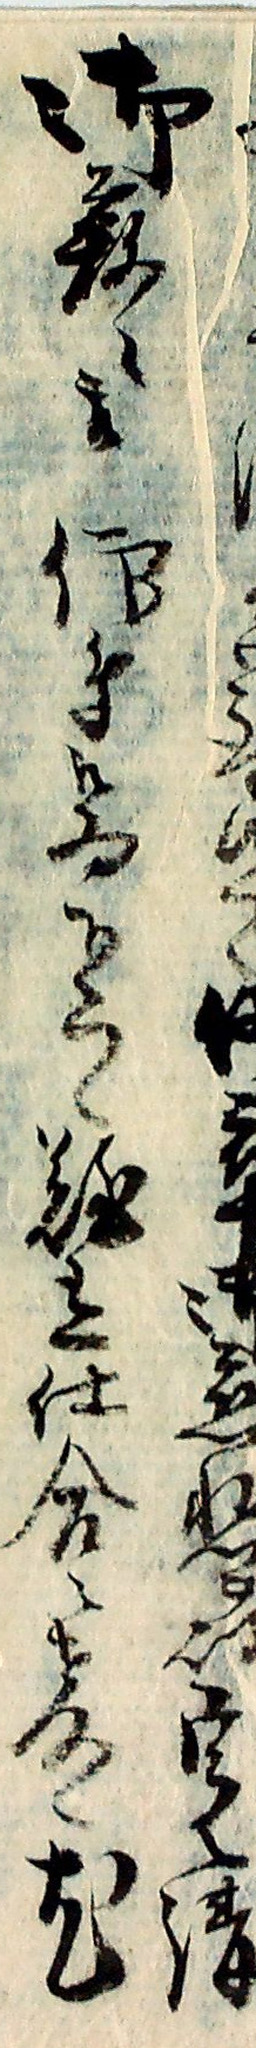御藪に被仰付被為下候はゝ難有仕合に奉存候尤
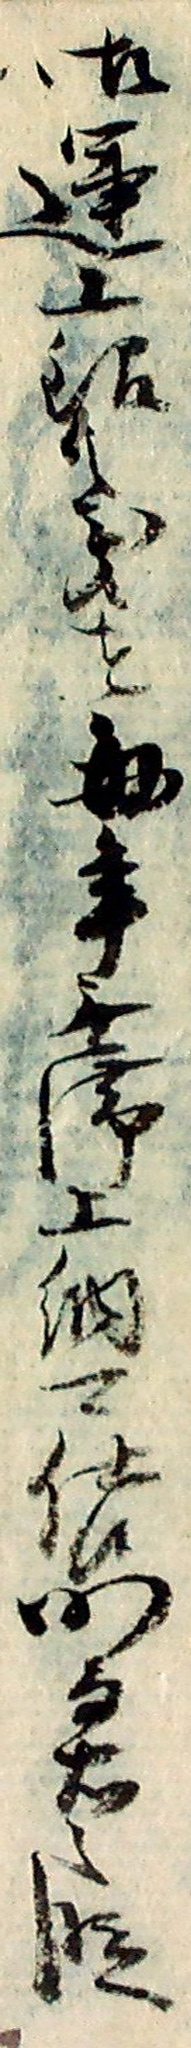御運上銀之義は毎年無滞上納可仕候仍て右之段
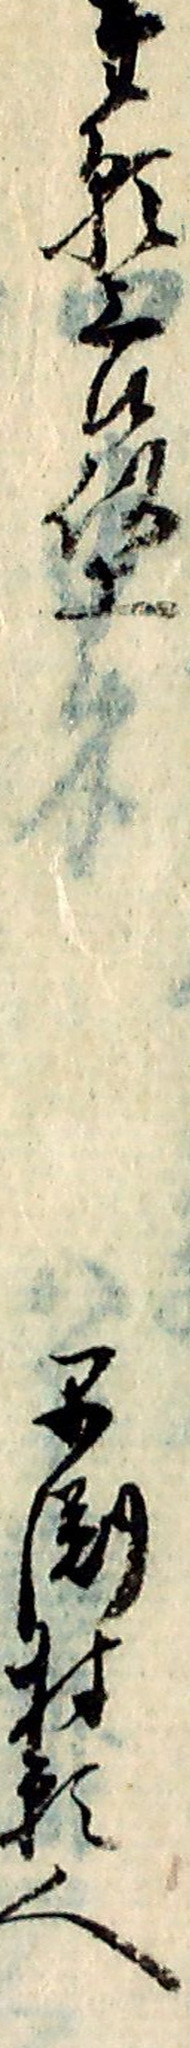奉願上候以上早淵村願人
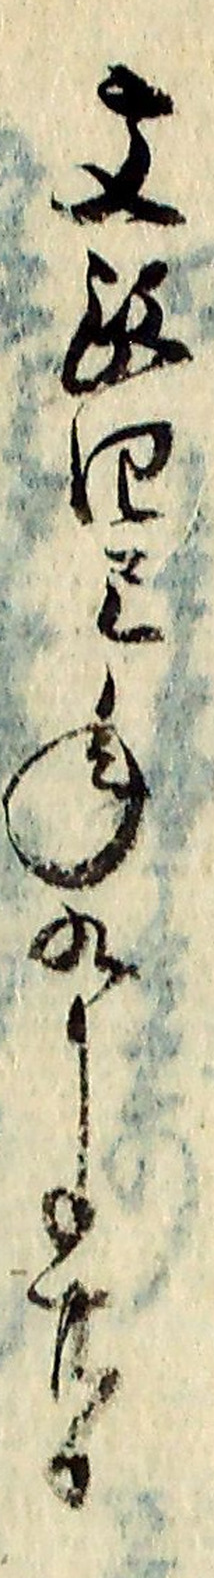文政四巳年九月仲助
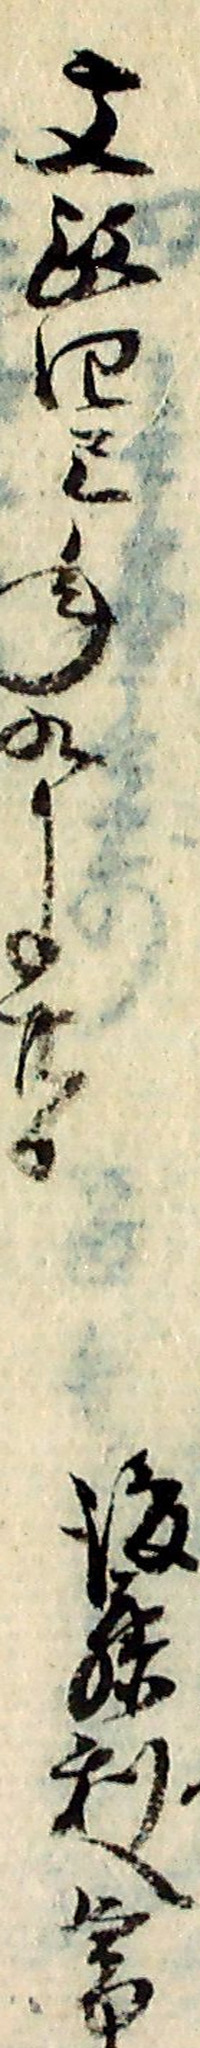文政四巳年九月廿日後藤利八郎
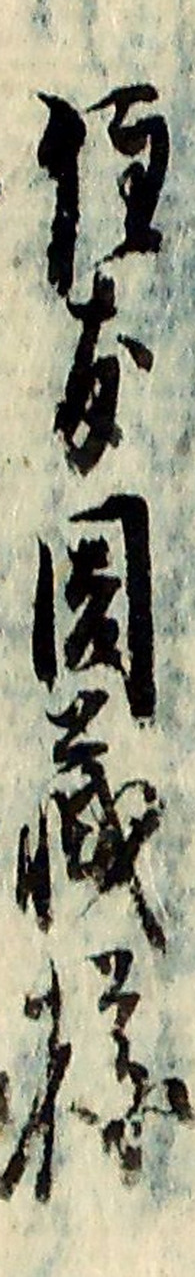住友周蔵様
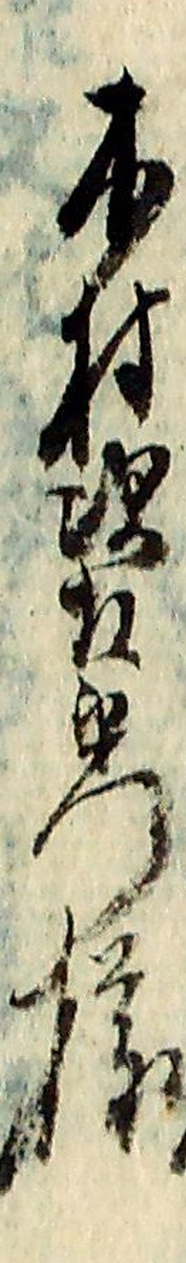木村次左衛門様
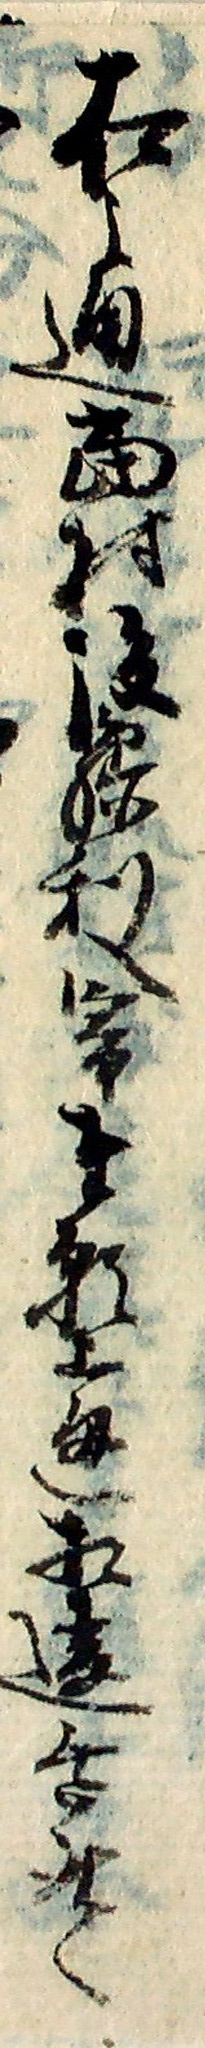右之通当村後藤利八郎奉願上通相違無御座候
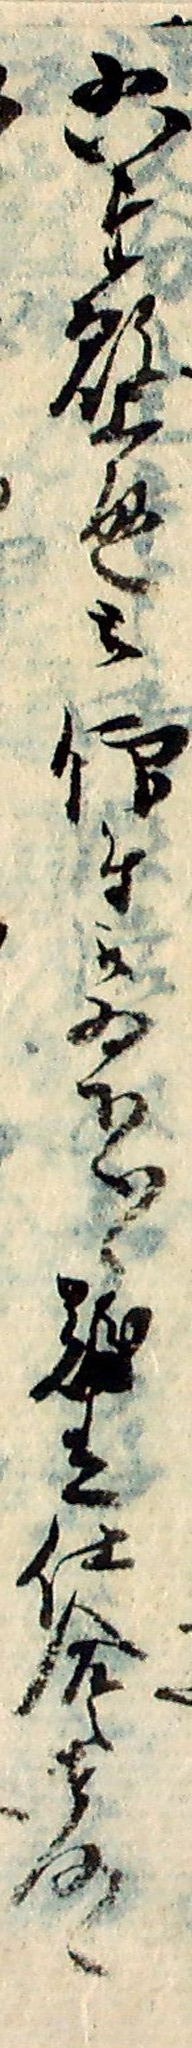右奉願上通被仰付被為下候はゝ難有仕合に奉存候
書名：諸御願書控(後藤氏壱番）
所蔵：鳴門教育大学 Naruto University of Education
